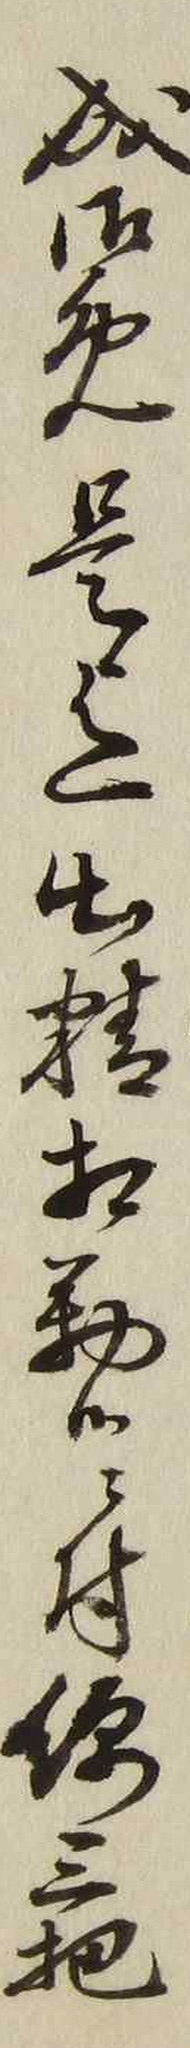成御免是迄出精相勤候ニ付綿三把
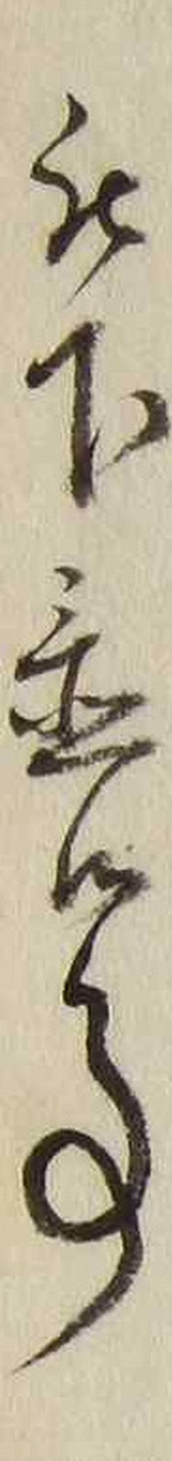被下置候事

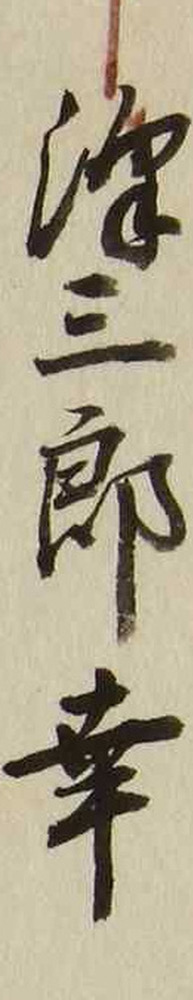沢三郎幸
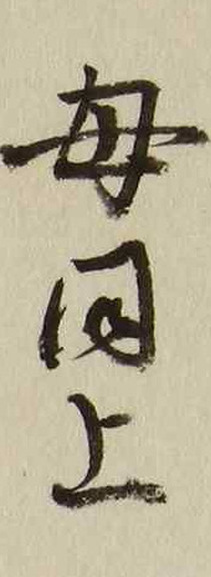母同上
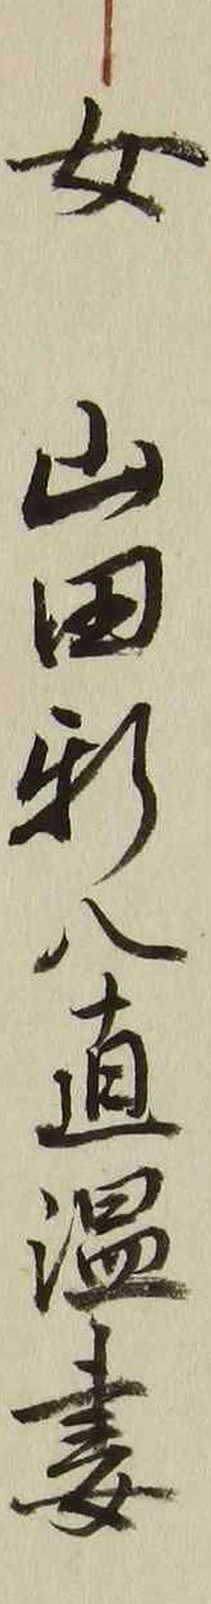女山田新八直温妻
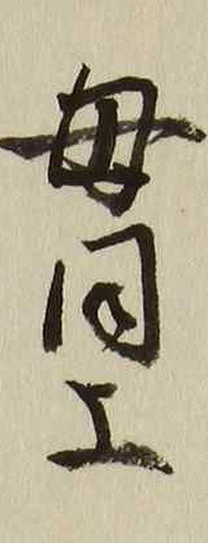母同上
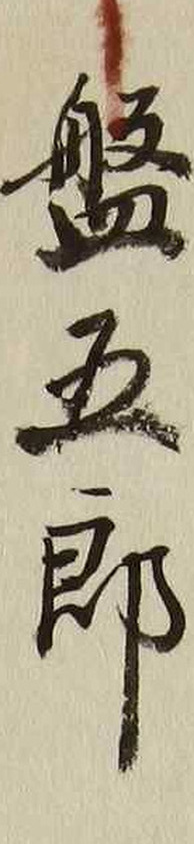盤五郎
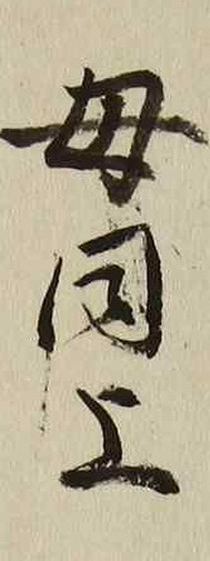母同上
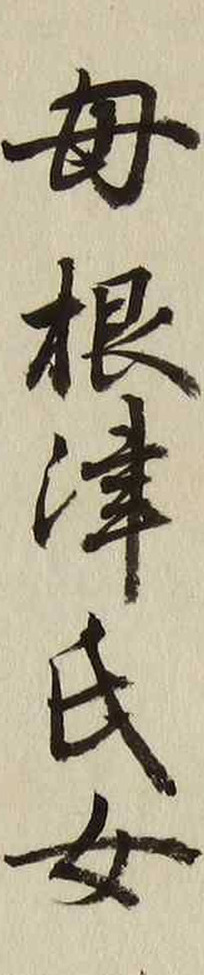母根津氏女
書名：諸士系譜　巻之35　は之部3
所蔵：会津若松市立会津図書館
